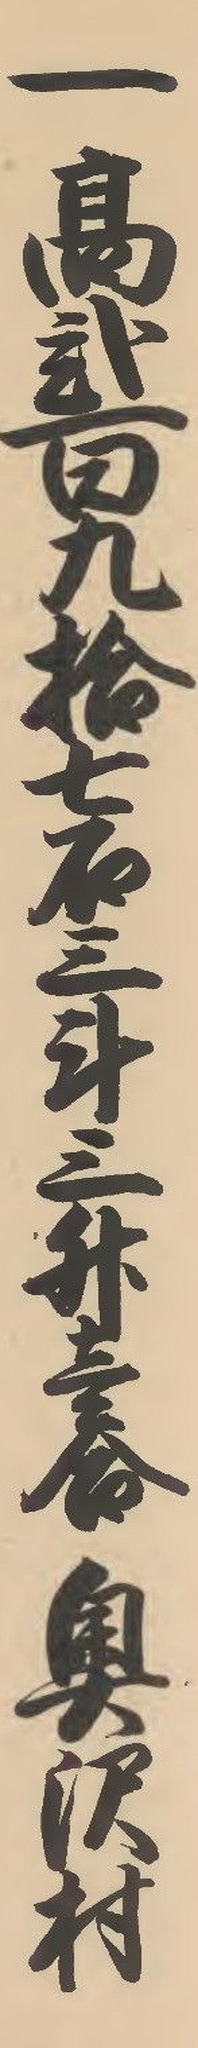一髙弐百九拾七石三斗三升壱合奥沢村
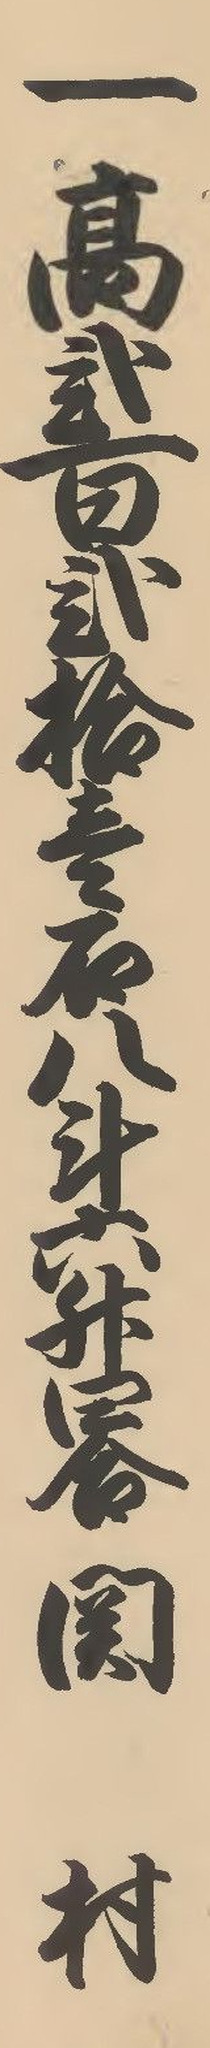一髙弐百弐拾壱石八斗六升四合関村
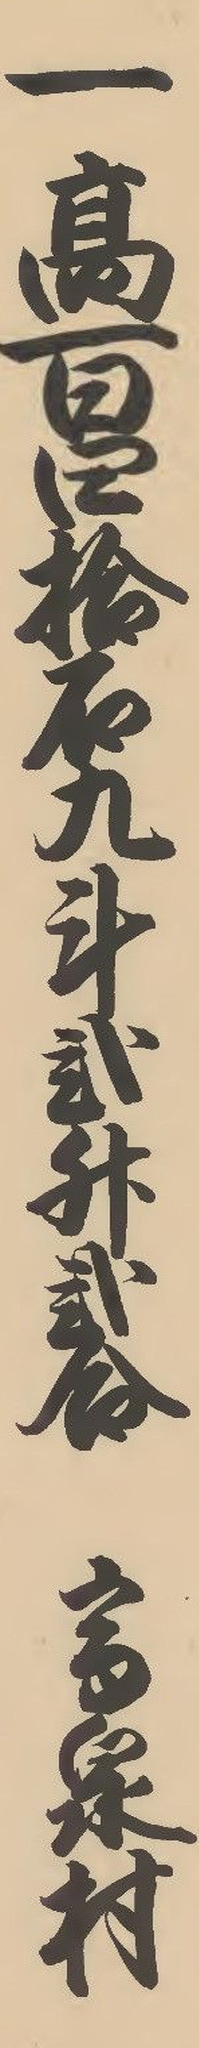一髙百四拾石九斗弐升弐合髙泉村
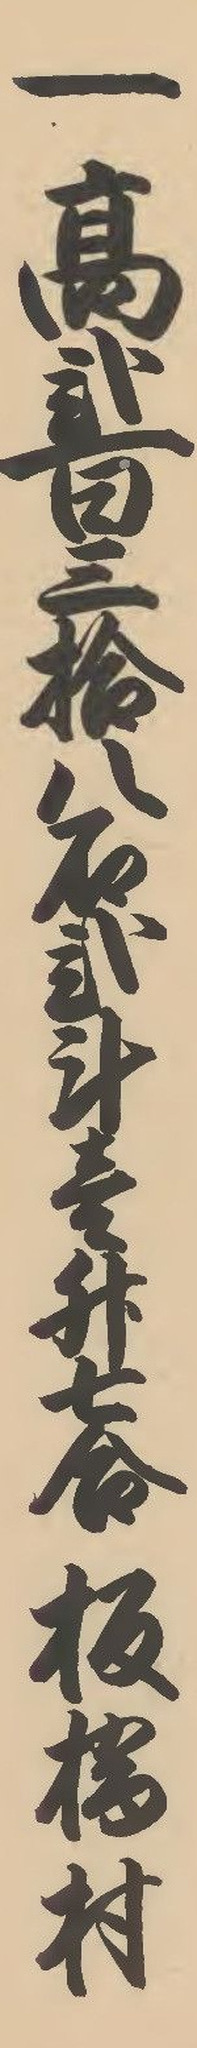一髙弐百三拾八石弐斗壱升七合板橋村

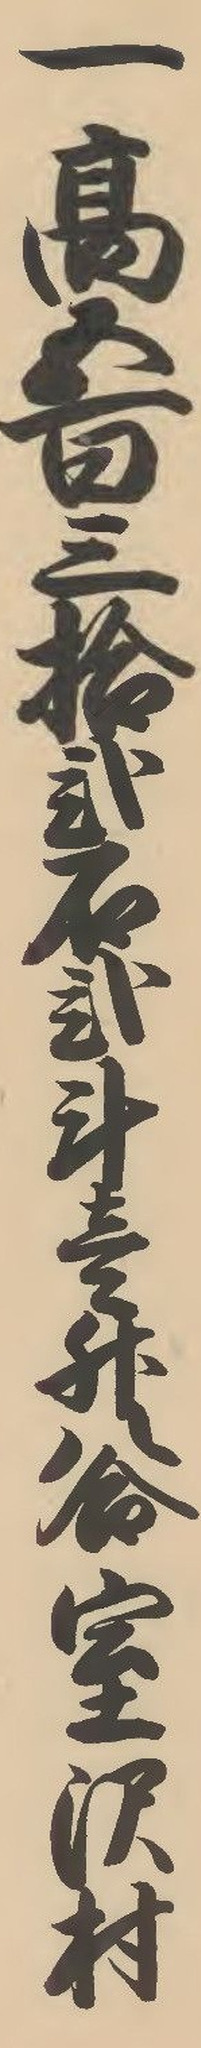一髙五百三拾弐石弐斗壱升八合室沢村
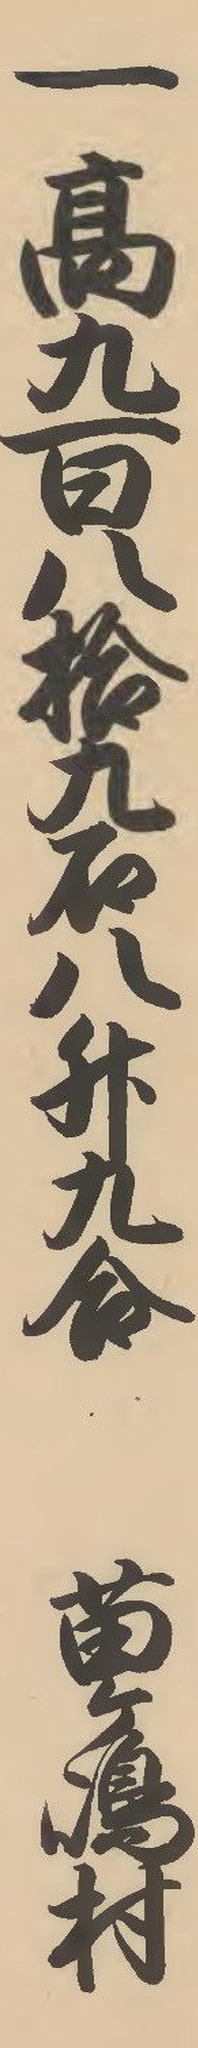一髙九百八拾九石八升九合苗ケ嶋村
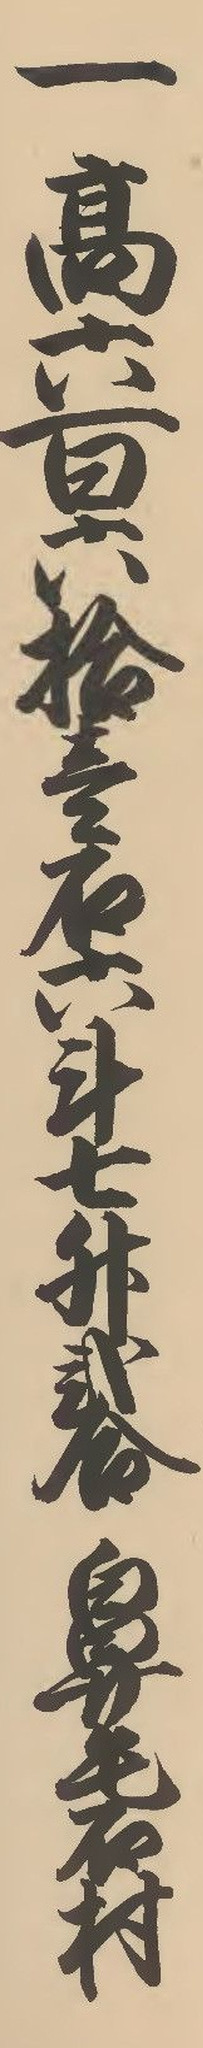一髙六百六拾壱石六斗七升弐合鼻毛石村
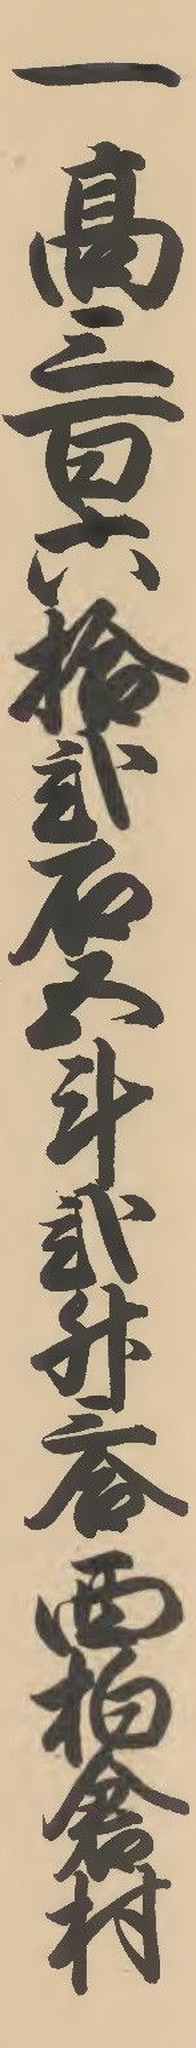一髙三百六拾弐石五斗弐升三合西柏倉村
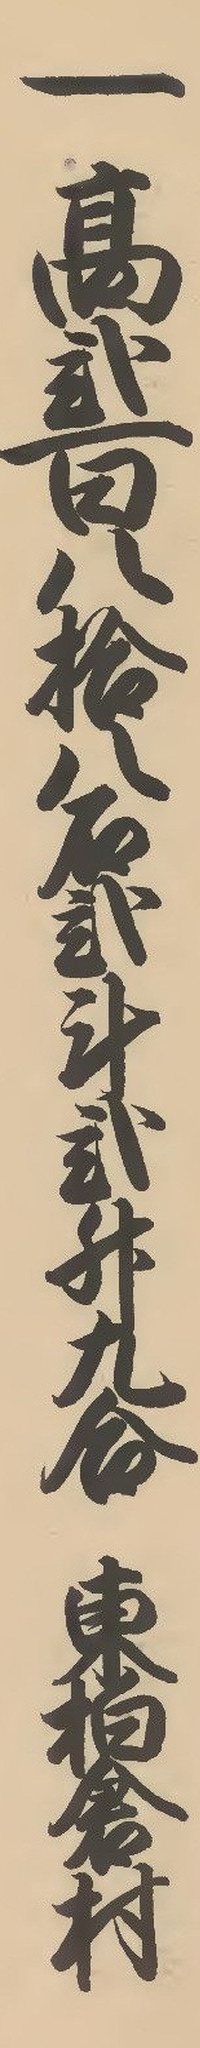一髙弐百八拾八石弐斗弐升九合東柏倉村
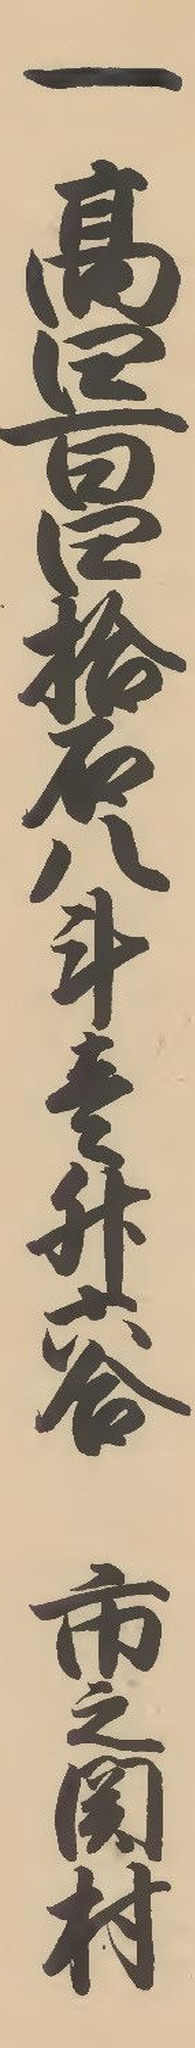一髙四百四拾石八斗壱升六合市之関村
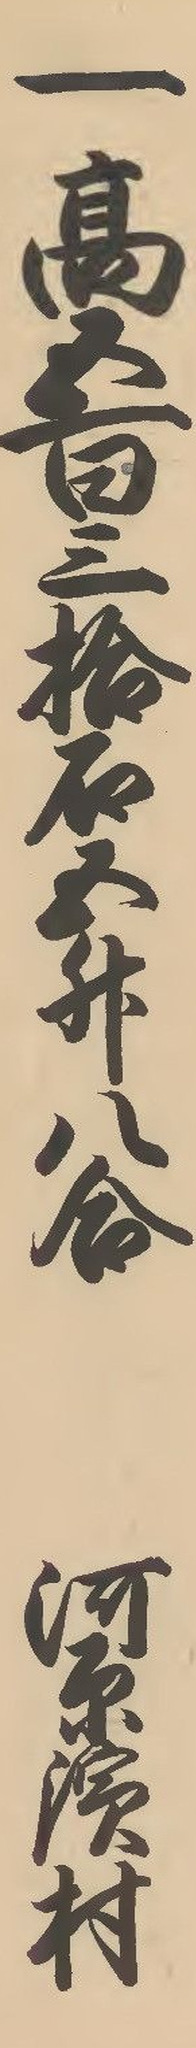一髙五百三拾石五升八合河原濱村

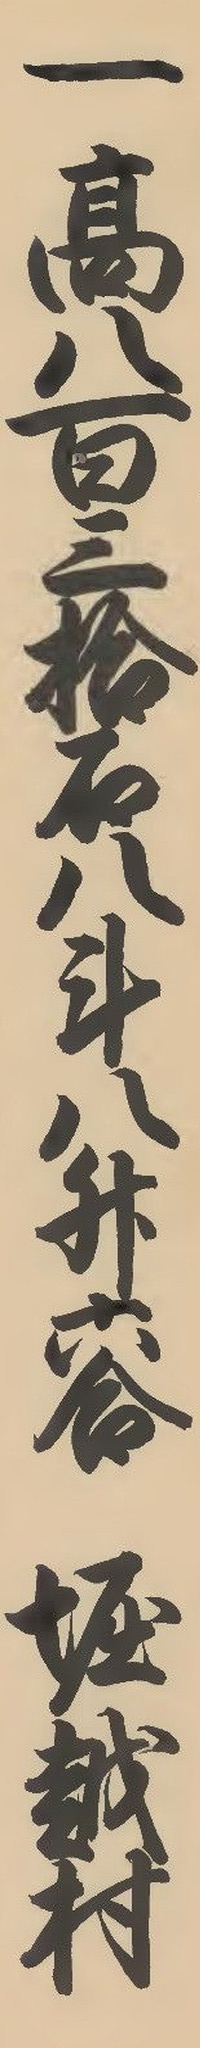一髙八百三拾石八斗八升六合堀越村
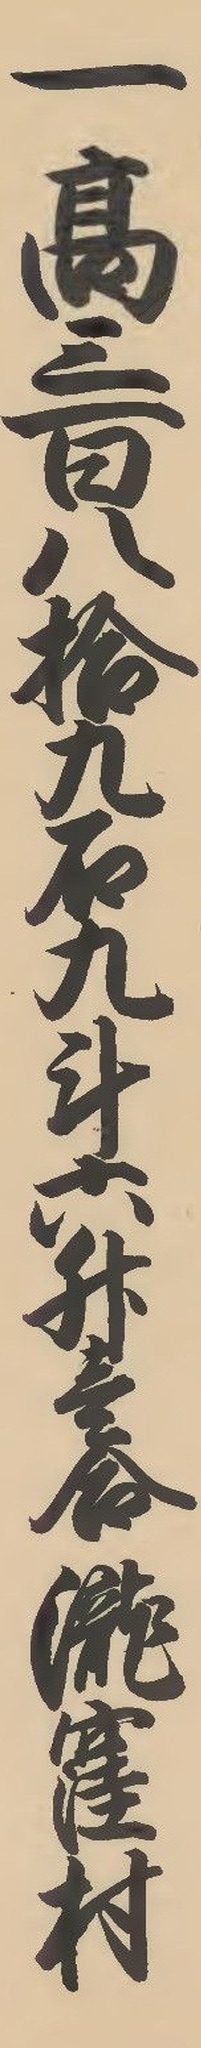一髙三百八拾九石九斗六升壱合瀧窪村
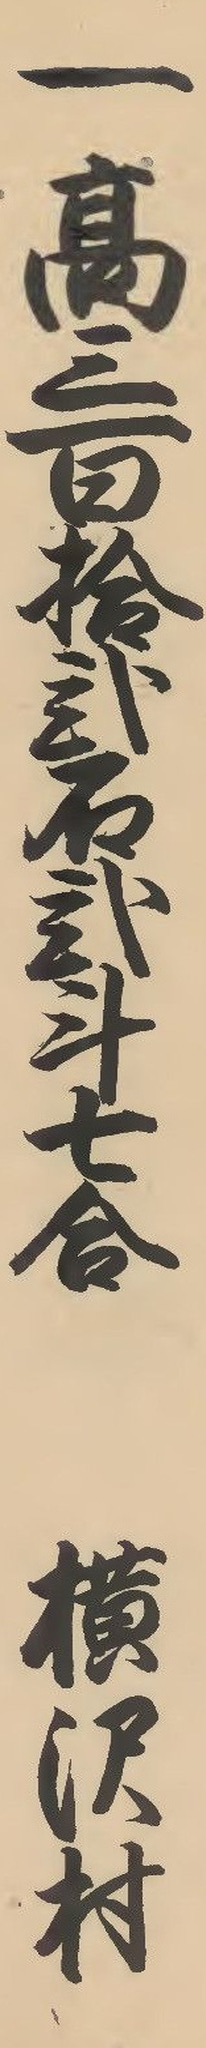一髙三百拾弐石弐斗七合横沢村
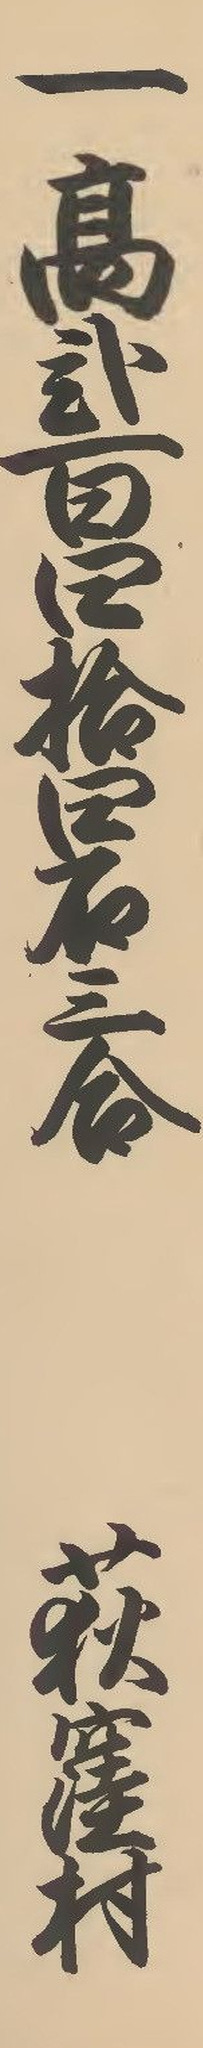一髙弐百四拾四石三合荻窪村
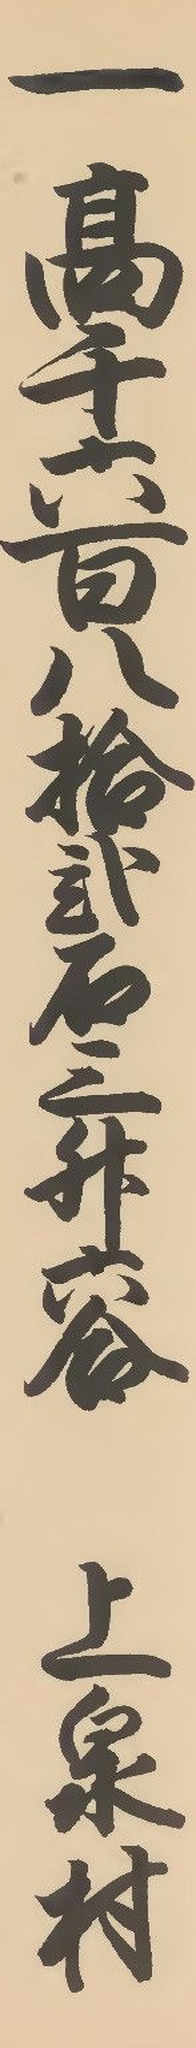一髙千六百八拾弐石三升六合上泉村
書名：上野国郷帳
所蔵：国立公文書館 National Archives of Japan
